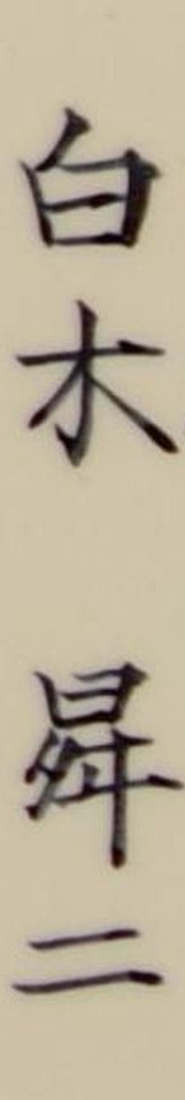白木昇二
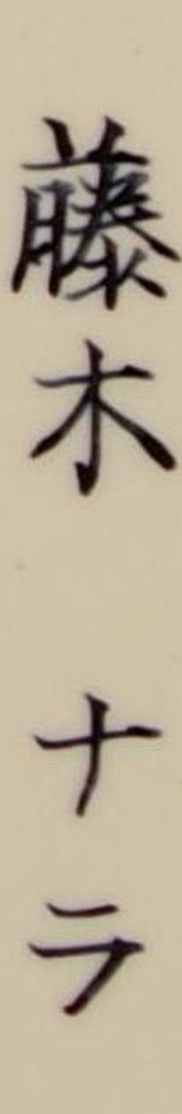藤木ナラ
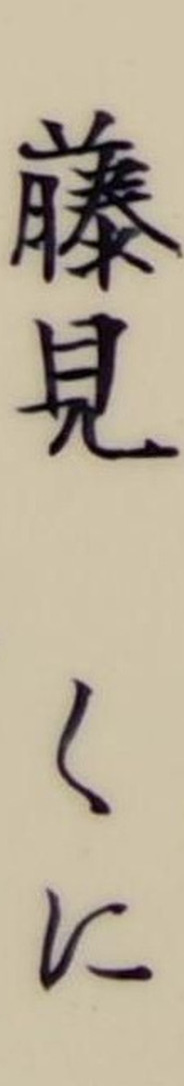藤見くに
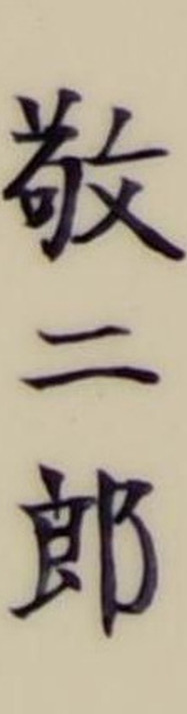敬二郎
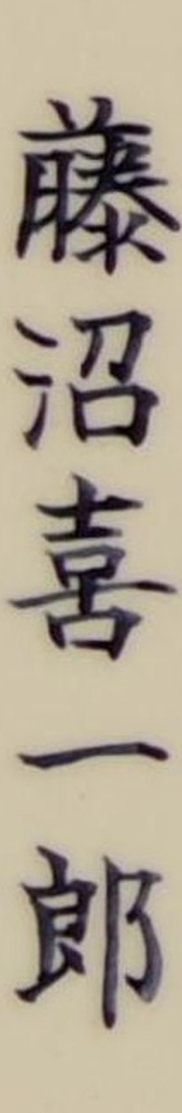藤沼喜一郎
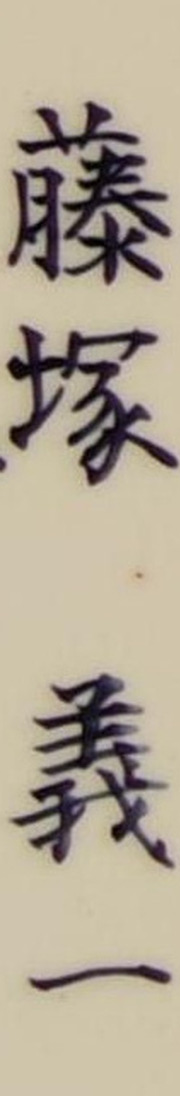藤塚義一

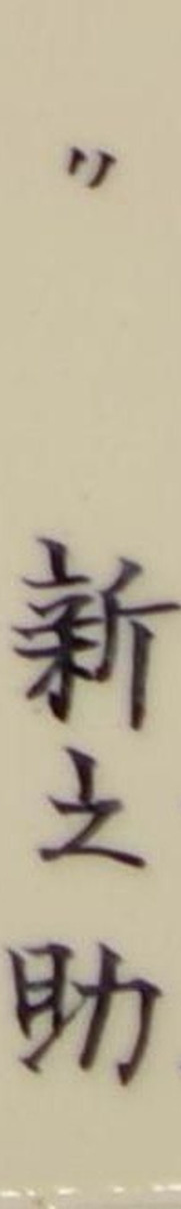新之助
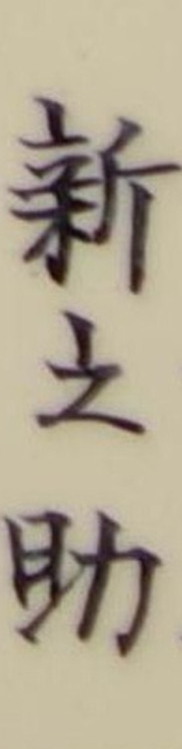新之助
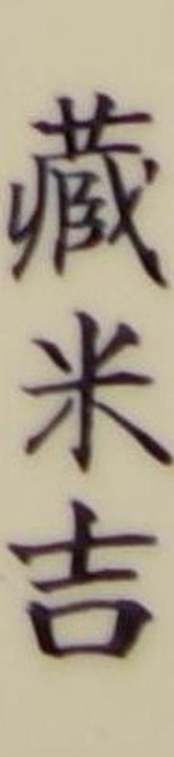蔵米吉
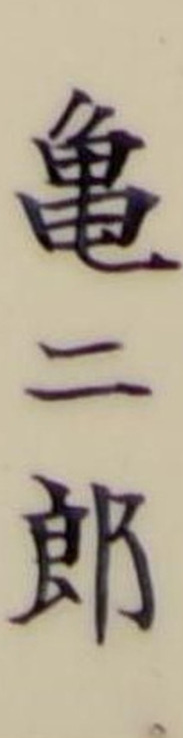亀二郎
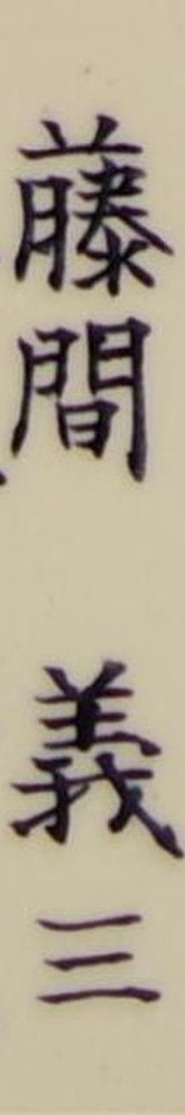藤間義三
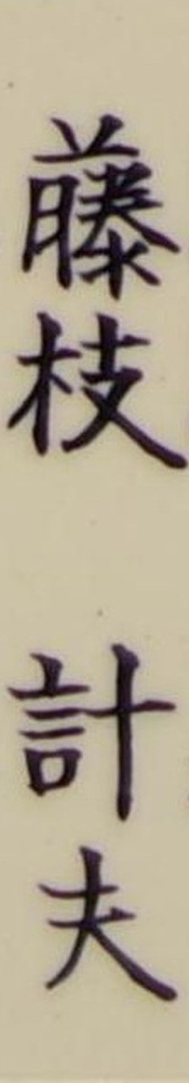藤枝計夫
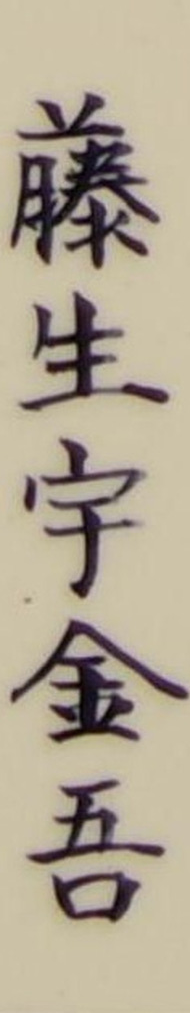藤生宇金吾
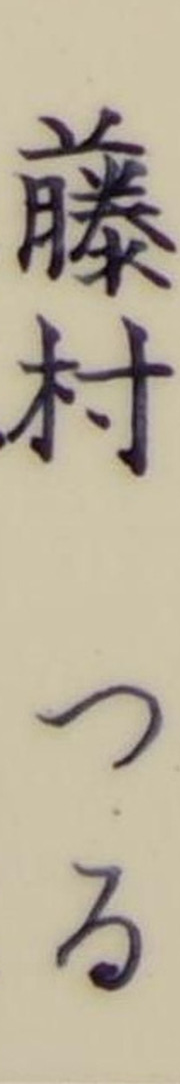藤村つる
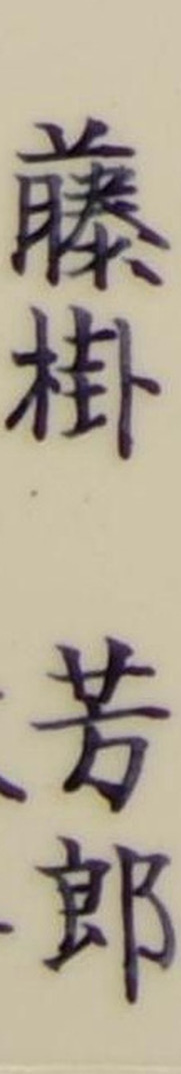藤掛芳郎

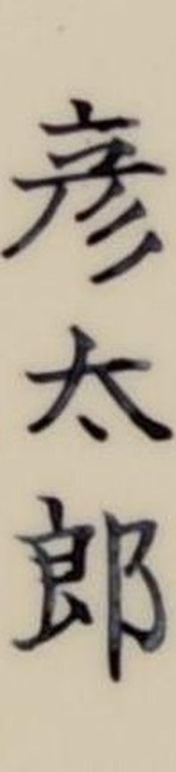彦太郎
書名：E~L
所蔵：高野山金剛峯寺
